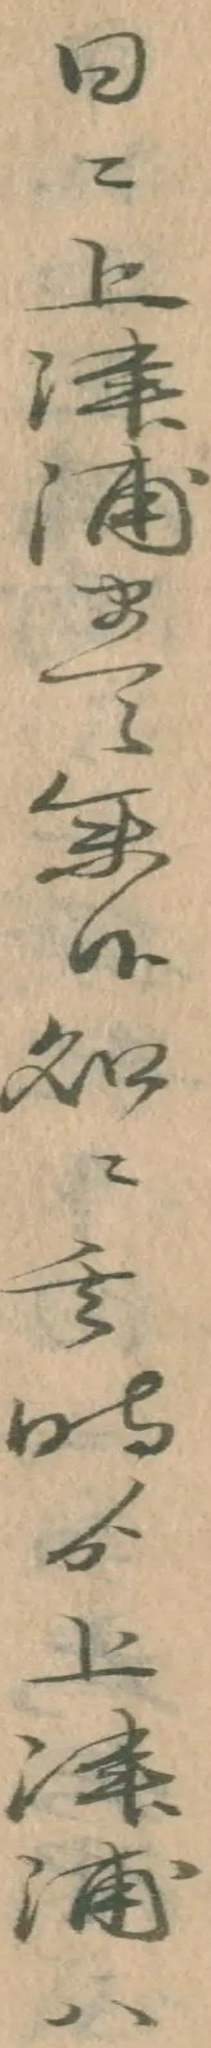日に上津浦まて参候処に其時ゟ上津浦は
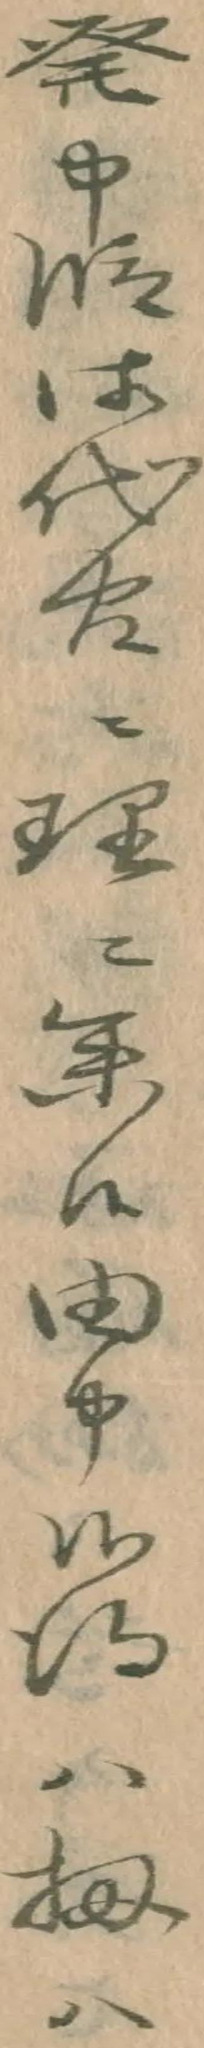発申段御代官に理に参候由申候得は扨は
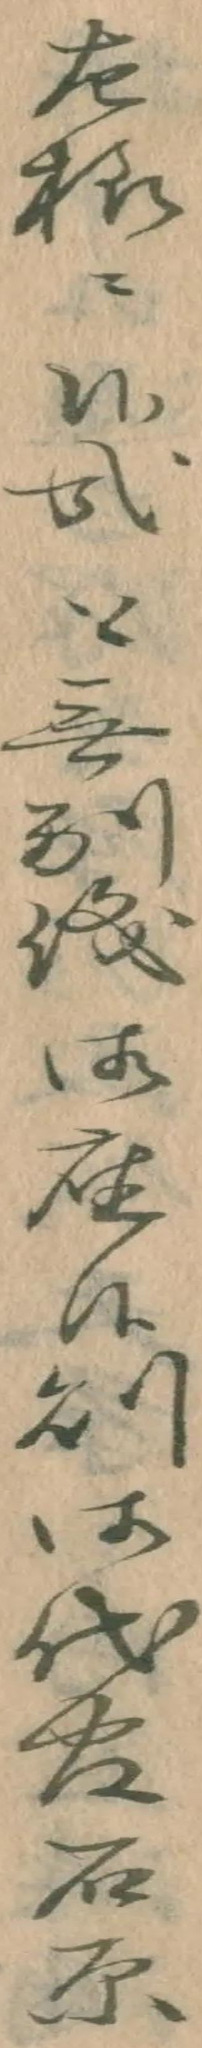左様に候哉と無別儀御座候則御代官石原
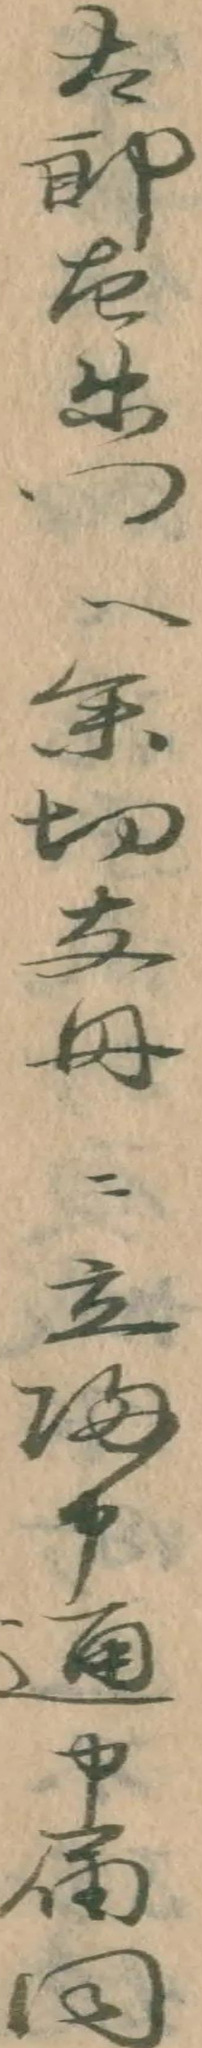太郎左衛門へ参切支丹に立帰申通申届同
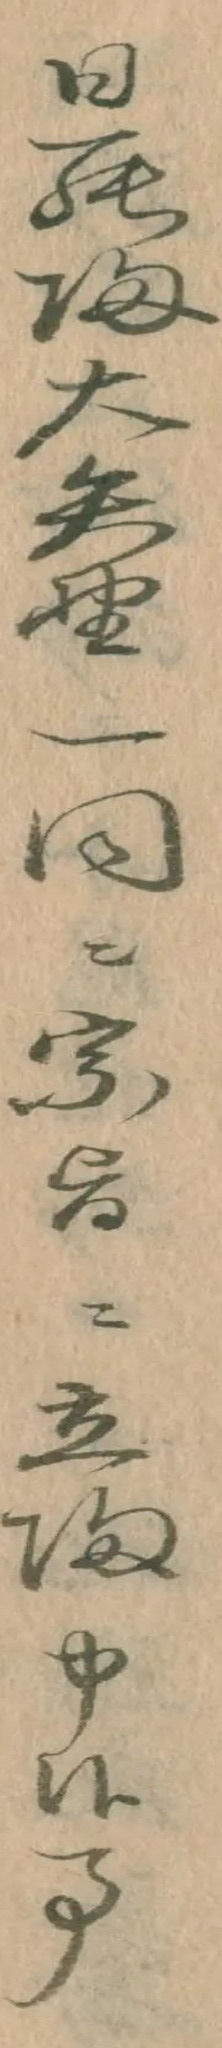日罷帰大矢野一同に宗旨に立帰申候事
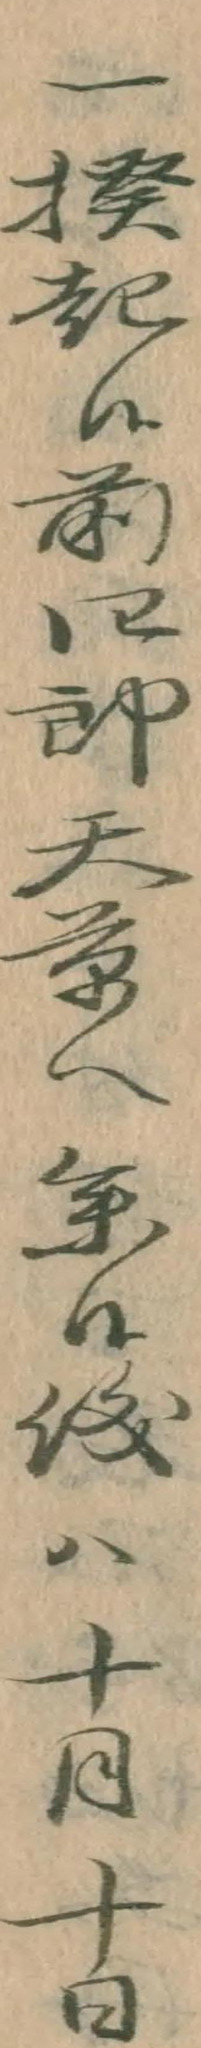一一揆起候前四郎天草へ参候儀は十月十日
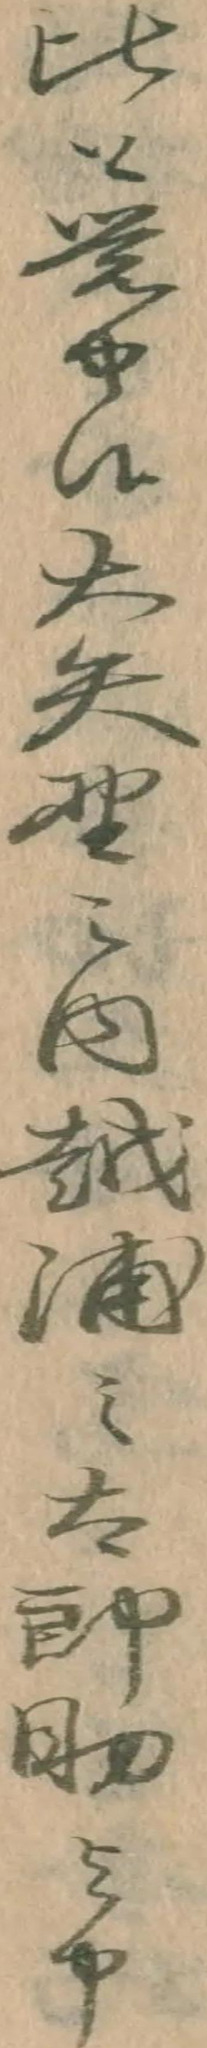比と覚申候大矢野之内越浦之太郎助与申
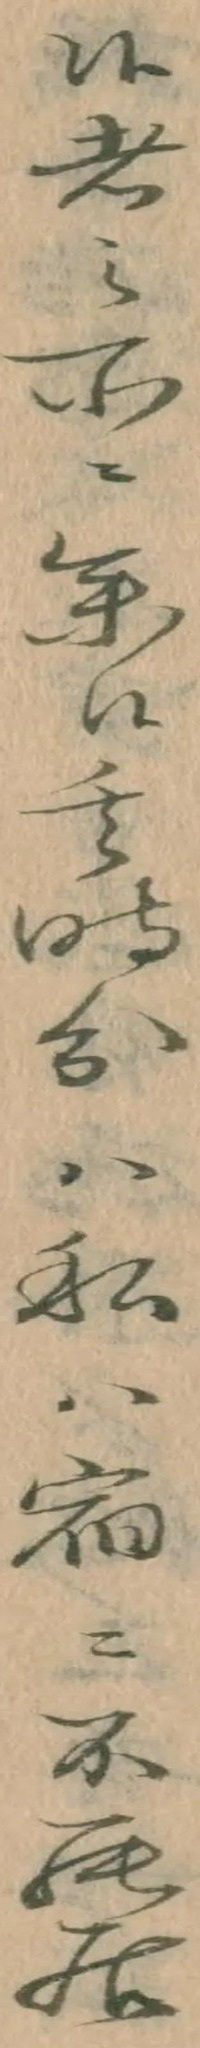候者之所に参候其時分は私は宿に不罷居
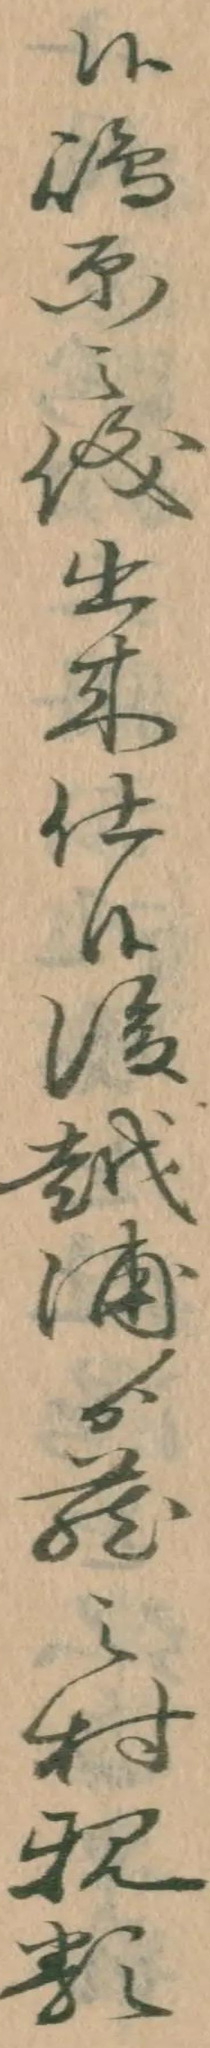候島原之儀出来仕候後越浦ゟ蔵之村親類
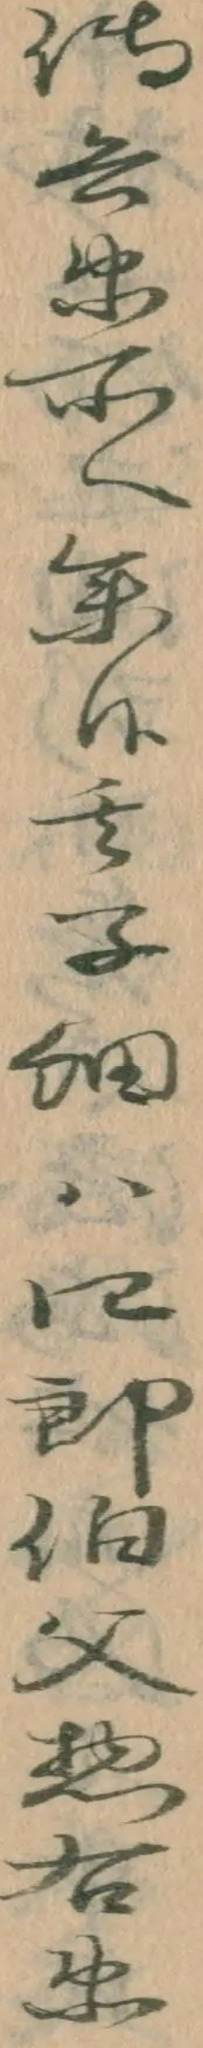伝兵衛所へ参候其子細は四郎伯父惣右衛
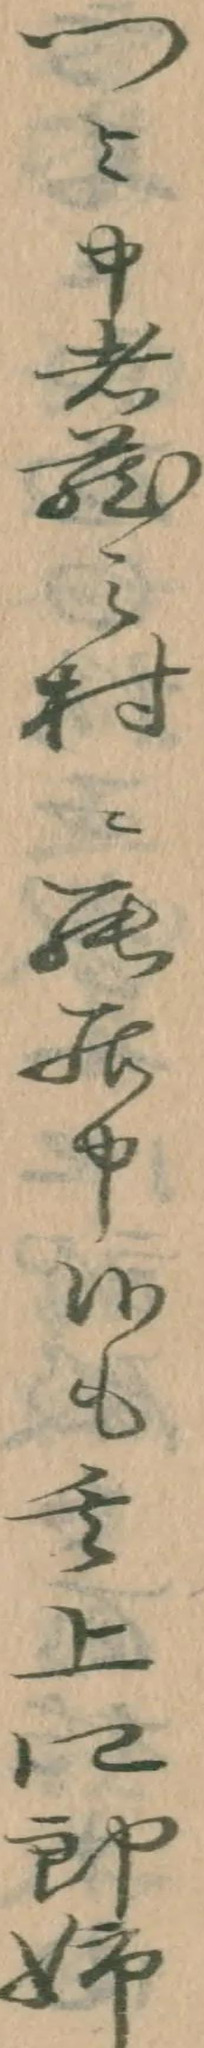門与申者蔵之村に罷居申候も其上四郎姉
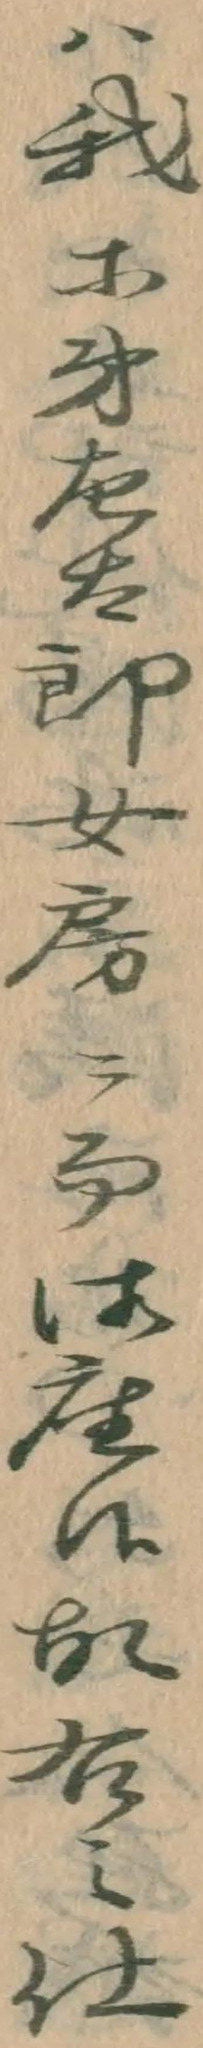は我等弟左太郎女房に而御座候故右之仕
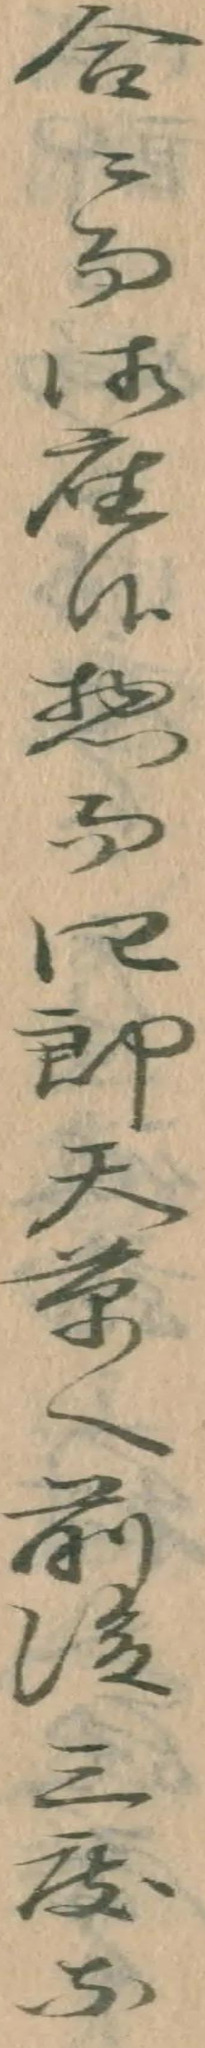合に而御座候惣而四郎天草へ前後三度な
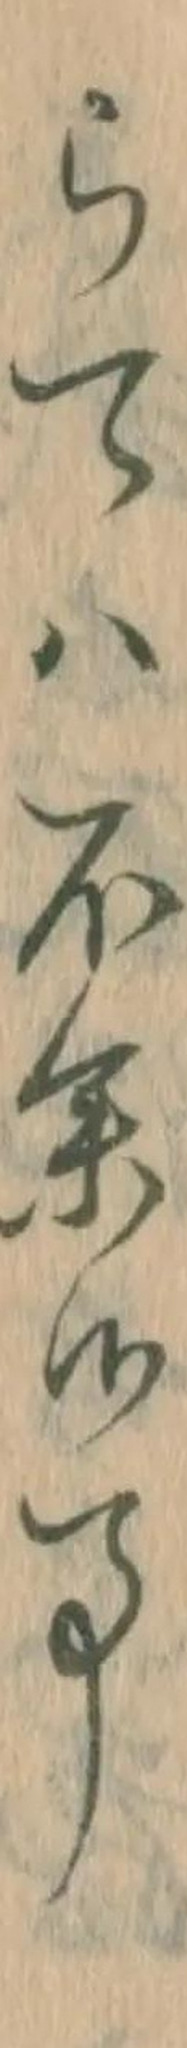らては不参候事
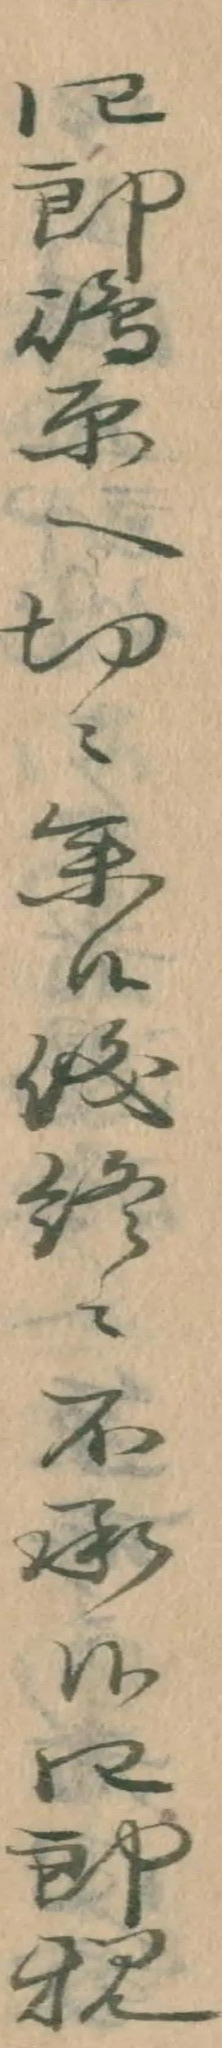一四郎島原へ切に参候儀終に不承候四郎親
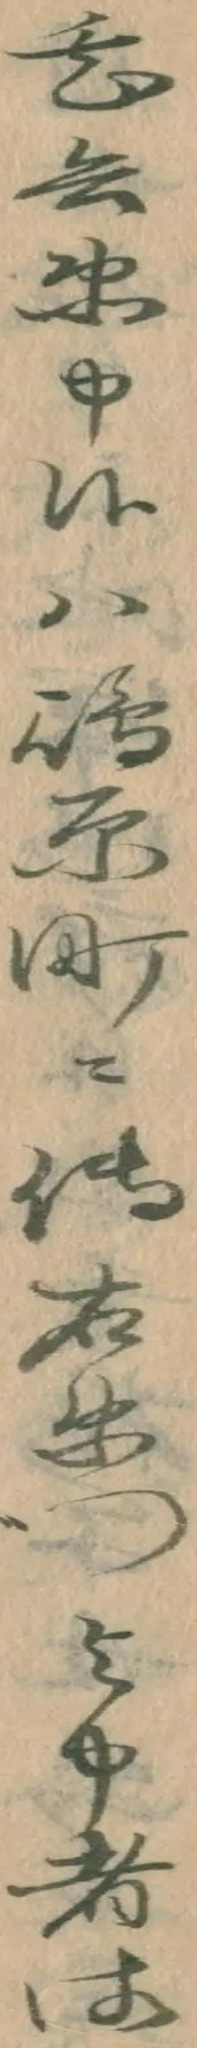甚兵衛申候は島原町に伝右衛門与申者御
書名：切支丹御退治記 49巻. [6]
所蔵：国立国会図書館 National Diet Library, JAPAN
